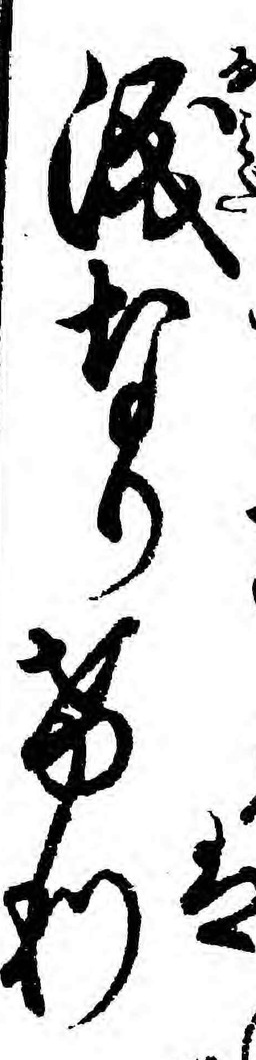涙なりけり
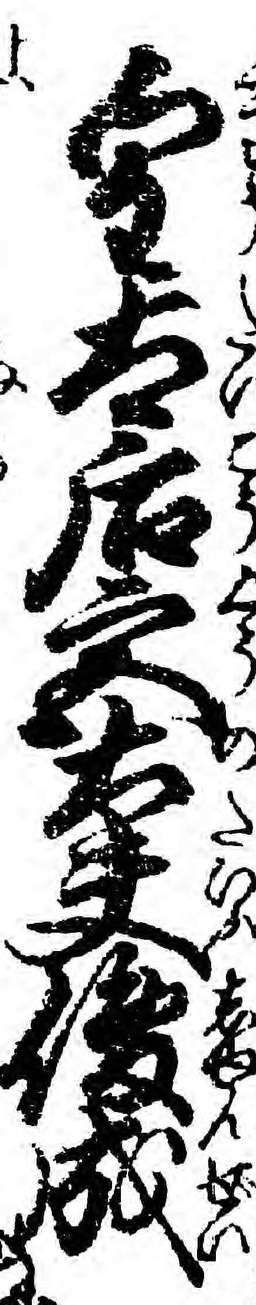皇太后宮大夫俊成
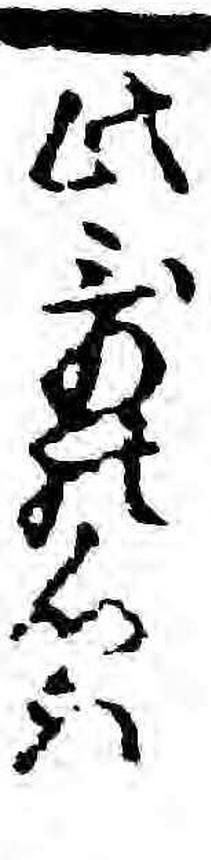此哥の心は
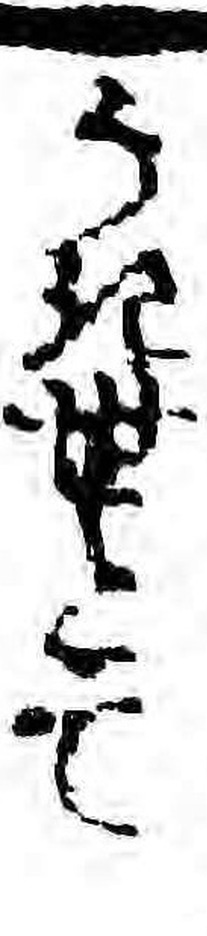うき世とて
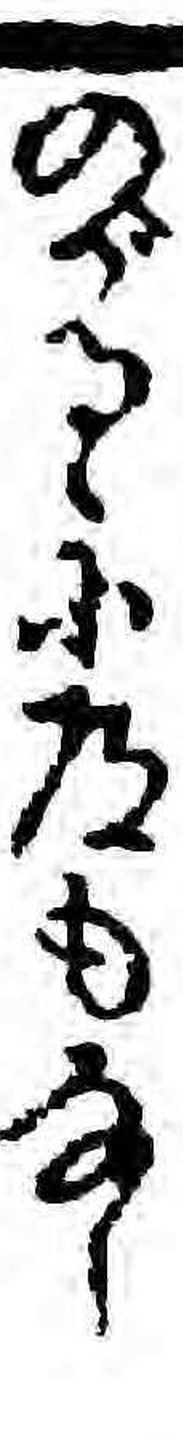のがるゝに道もなし
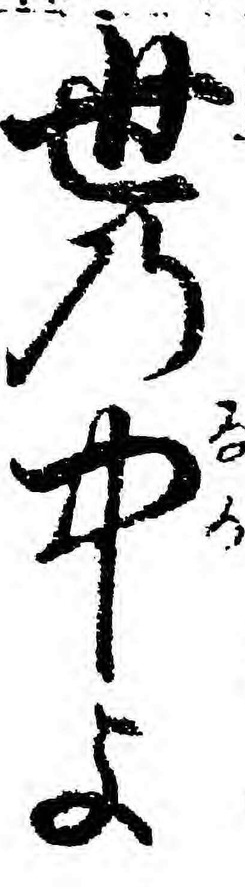世の中よ
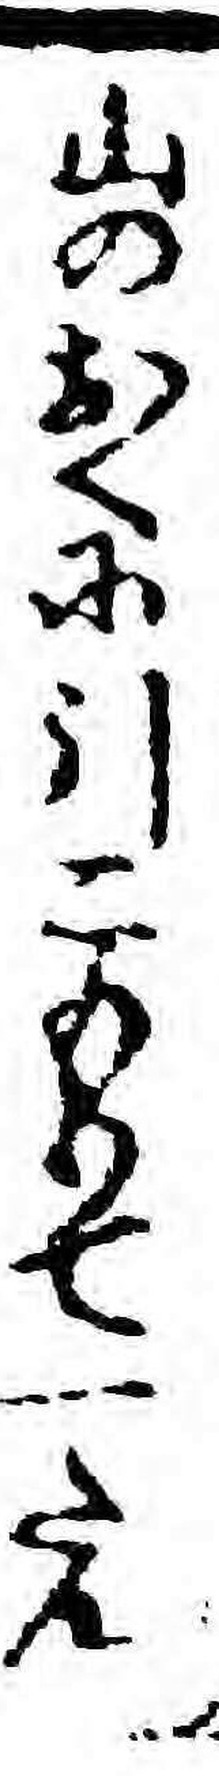山のおくに引こもりて一たん
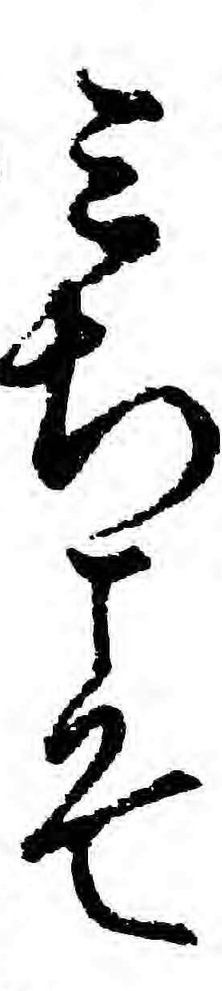みちこそ
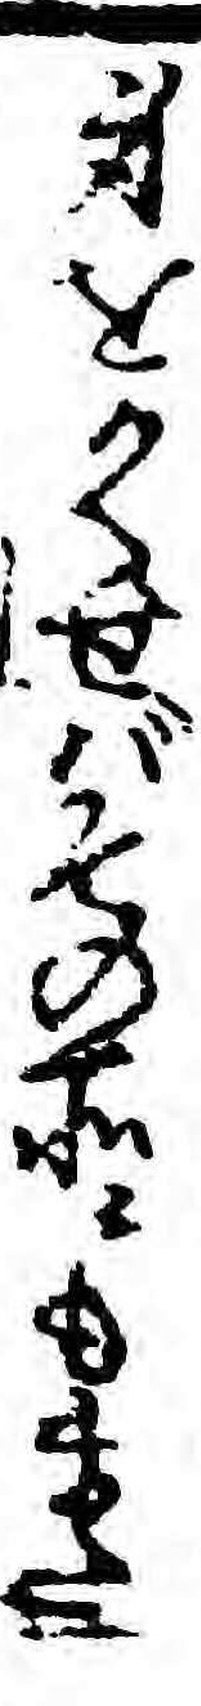身をかくせばその所にもまた
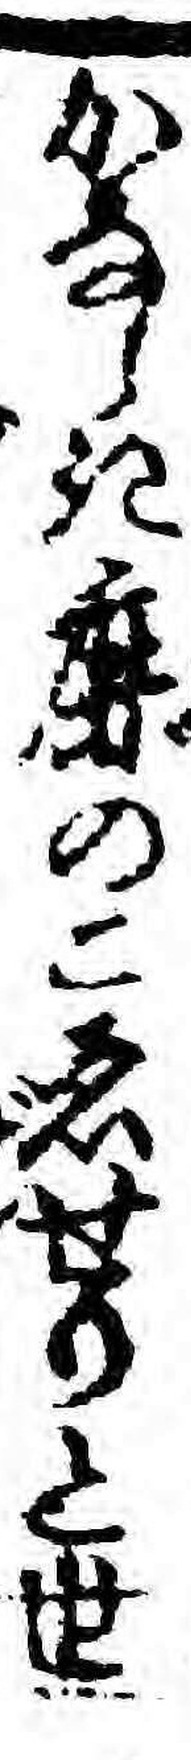かなしき鹿のこゑせりと世
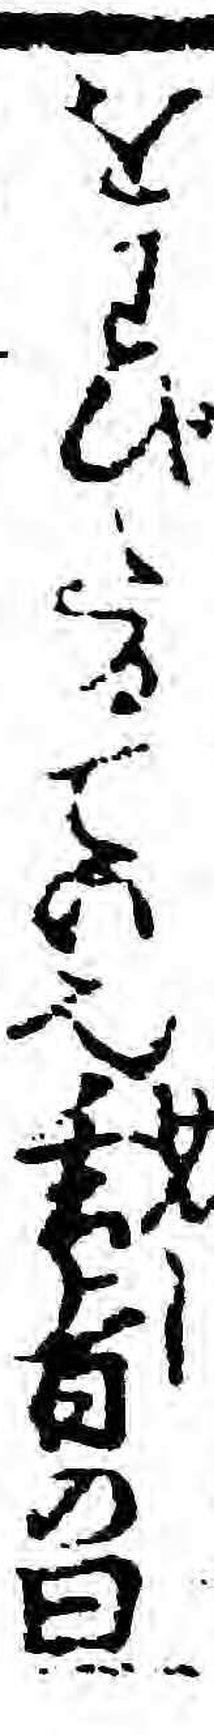をわびたるてい也玄旨の曰
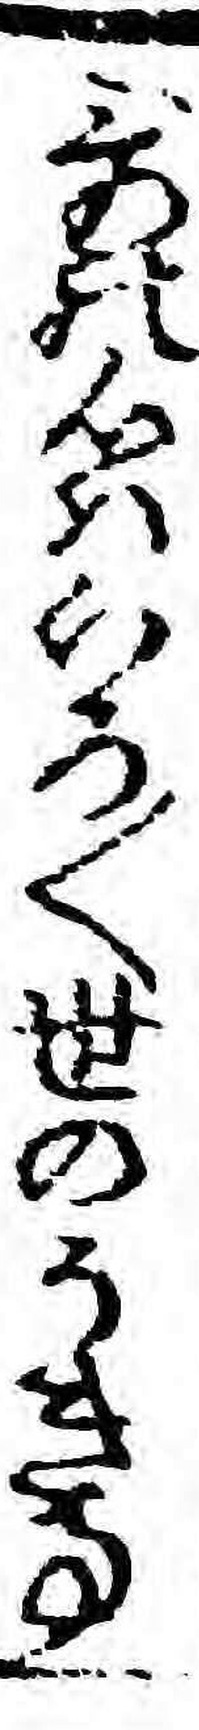哥の心はいろ〳〵世のうき事
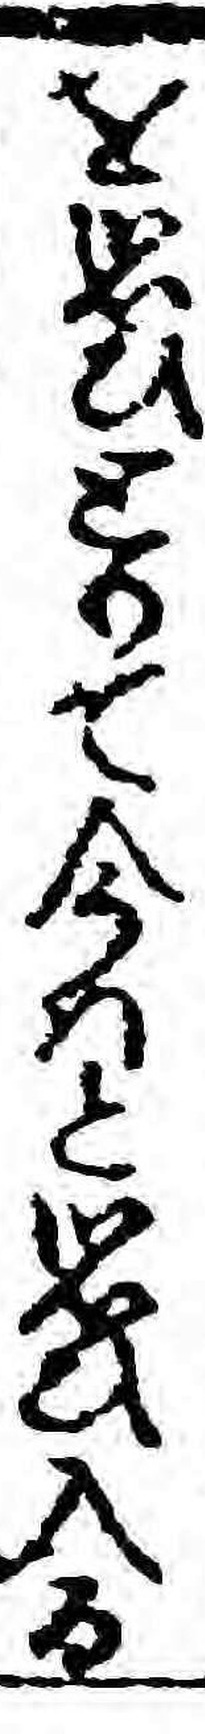を思ひとりて今はと思ひ入る
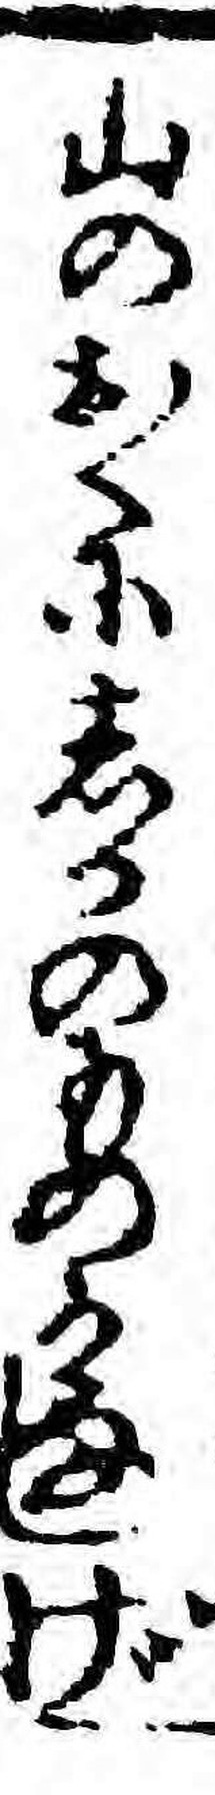山のおくに鹿のものかなしげ
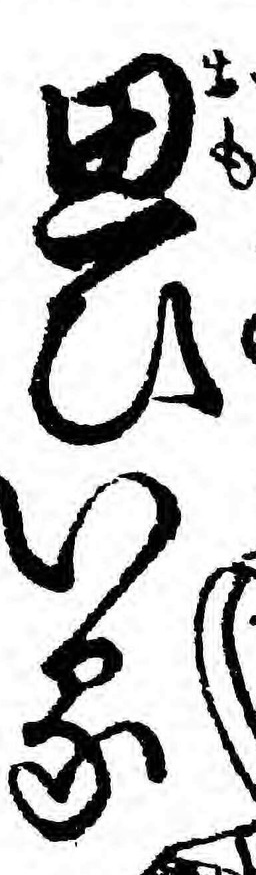思ひいる
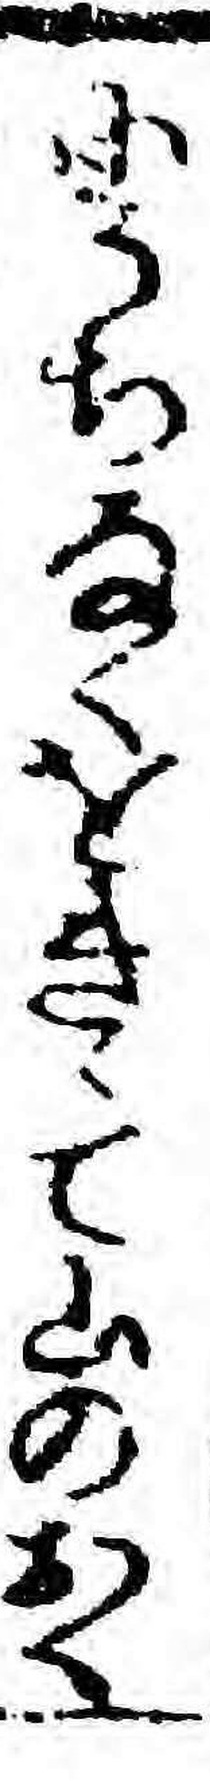にうちなくをきゝて山のおく
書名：頭書和歌注譯／壽賀多百人一首小倉錦
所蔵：国文学研究資料館
